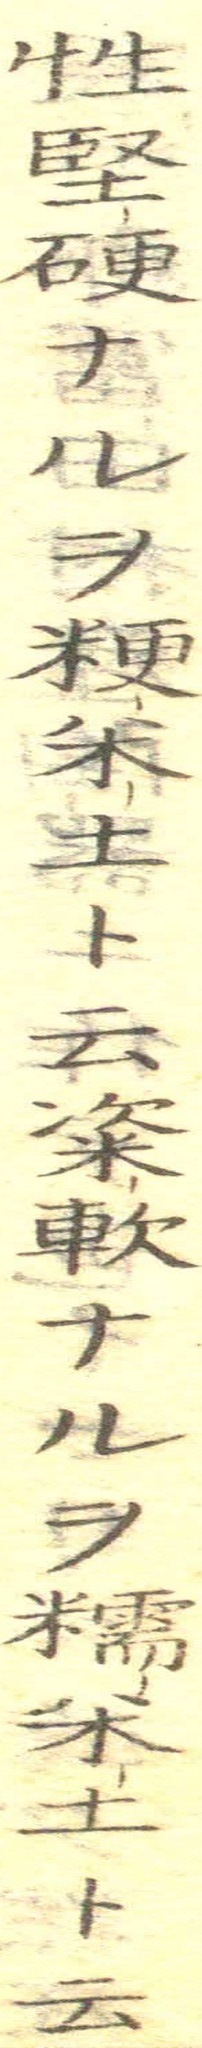性堅-硬ナルヲ粳-米-土ト云粢-軟ナルヲ糯-米-土ト云
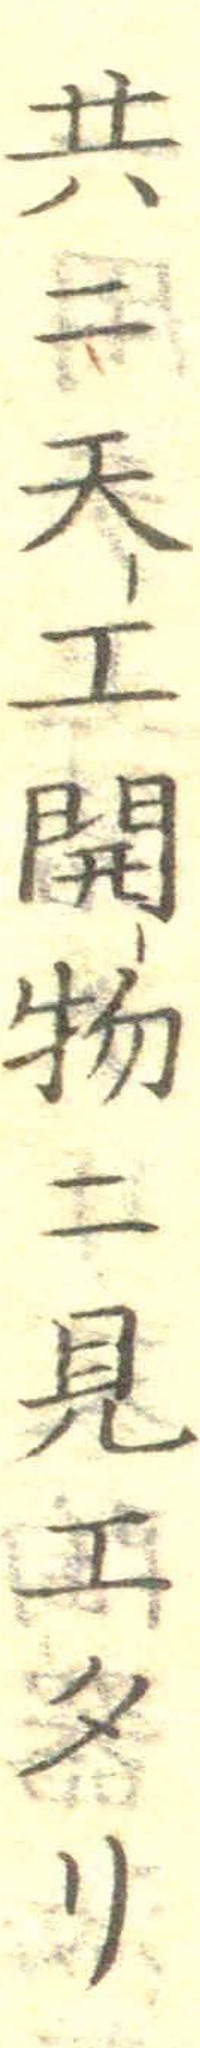共ニ天-工開-物ニ見エタリ
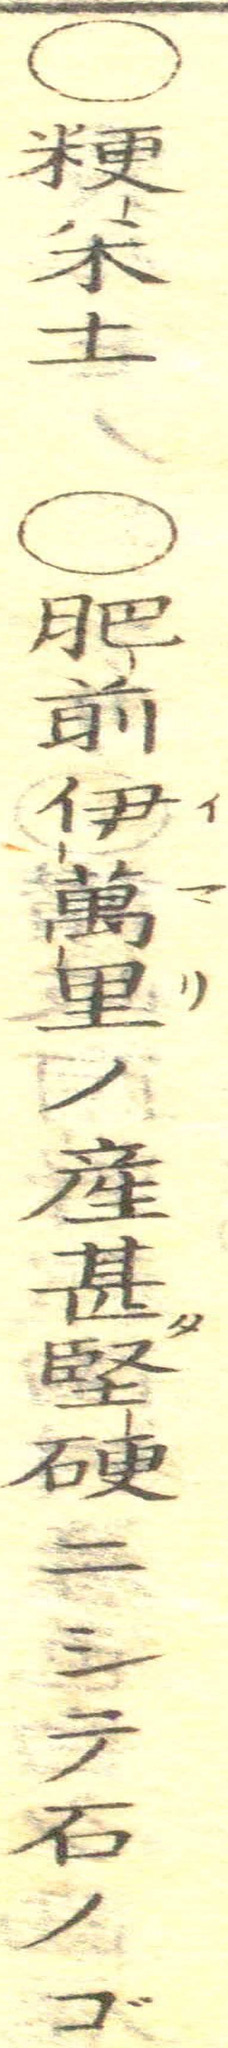○粳-米土○肥-前伊万里ノ産甚堅-硬ニシテ石ノゴ
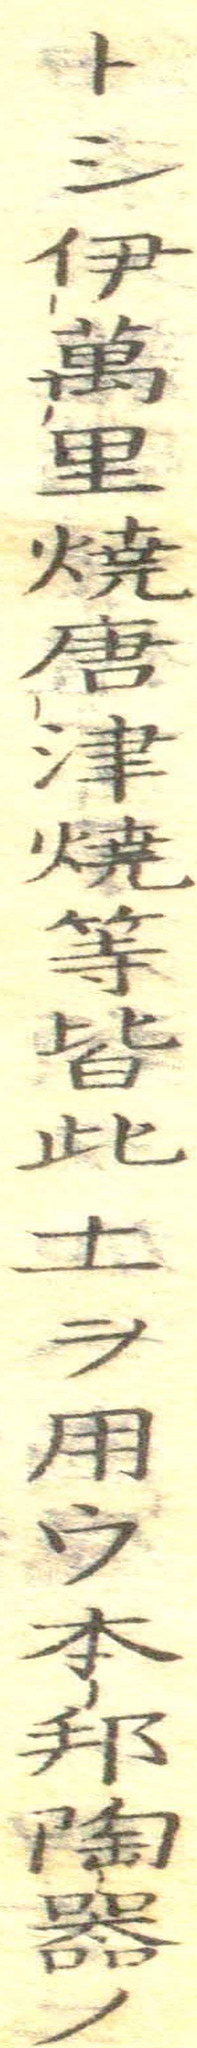トシ伊-萬-里焼唐-津焼等皆此土ヲ用ウ本-邦陶-器ノ
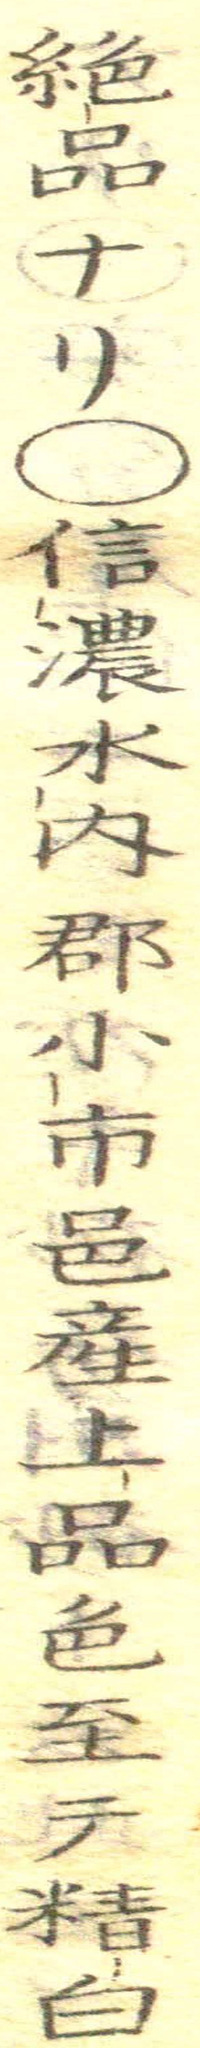絶品ナリ○信-濃水-内郡小-市邑産上-品色至テ精-白

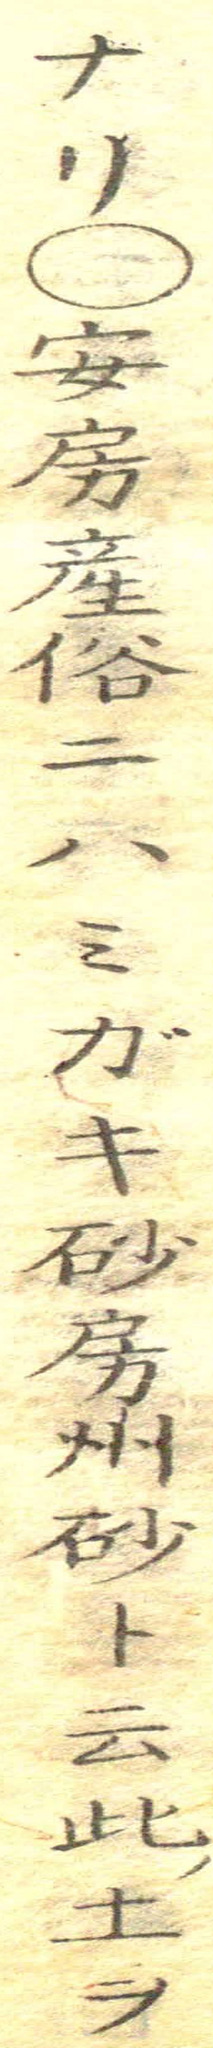ナリ○安房産俗ニハミガキ砂房州砂ト云此土ヲ
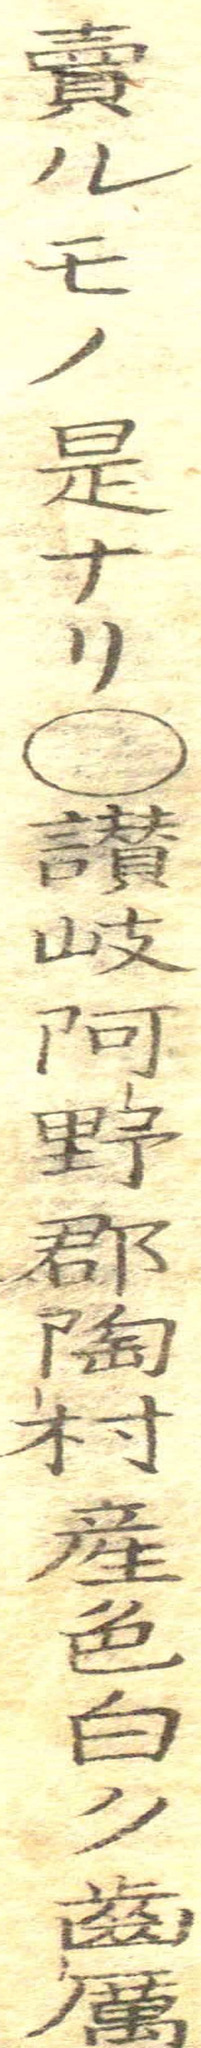売ルモノ是ナリ○讃岐阿-野郡陶-村産色白ク歯-厲
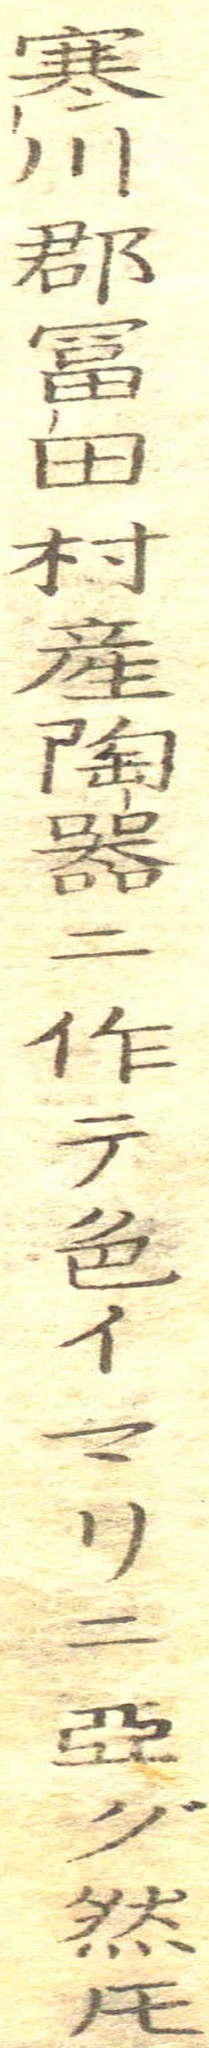寒-川郡富-田村産陶-器ニ作テ色イマリニ亞グ然トモ
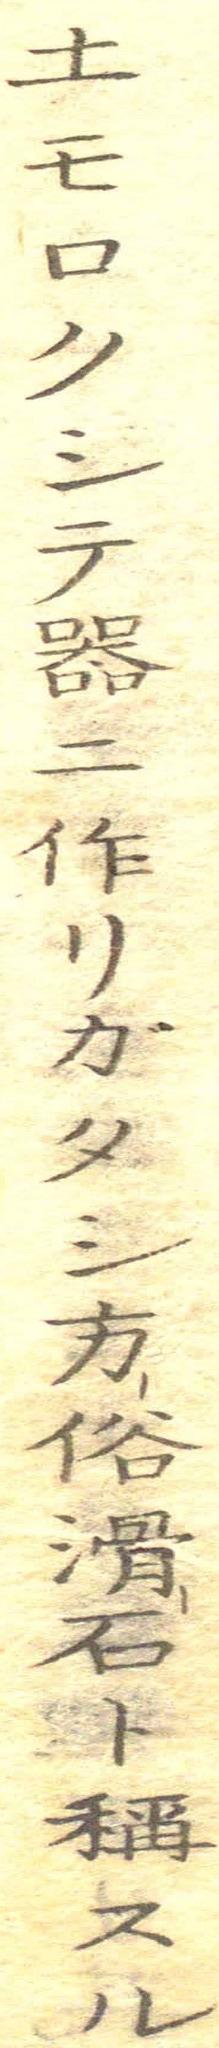土モロクシテ器ニ作リカタシ方-俗滑-石ト称スル
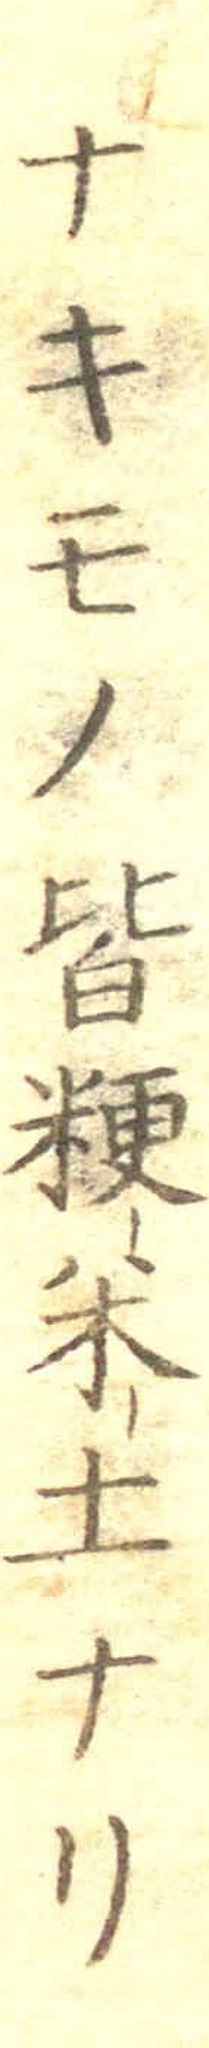ナキモノ皆粳-米-土ナリ
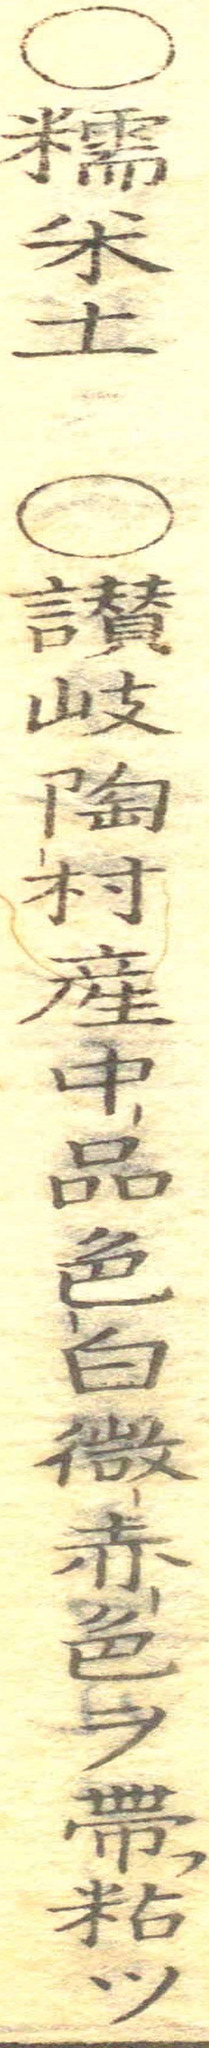○糯米土○讃岐陶-村産中-品色-白微-赤-色ヲ帯粘ツ
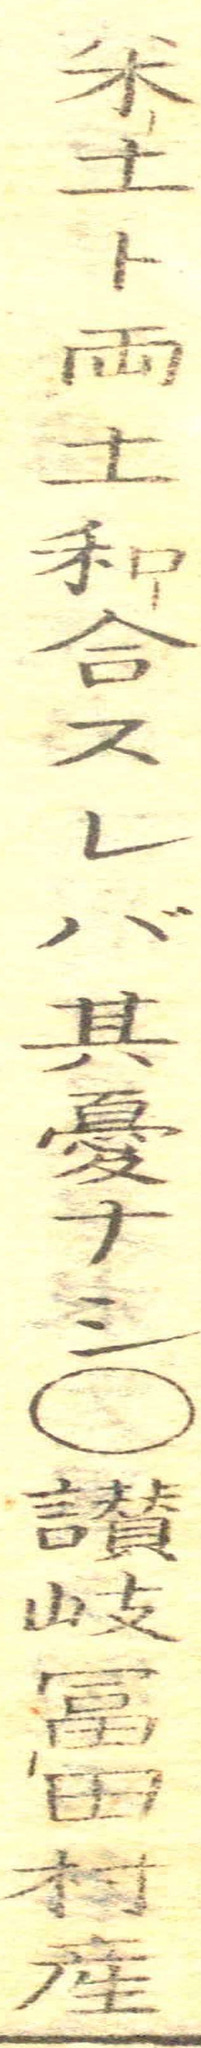米土ト両土和-合スレバ其憂ナシ○讃岐冨-田村産
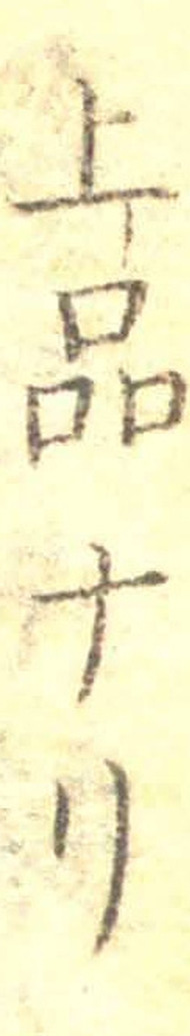上品ナリ
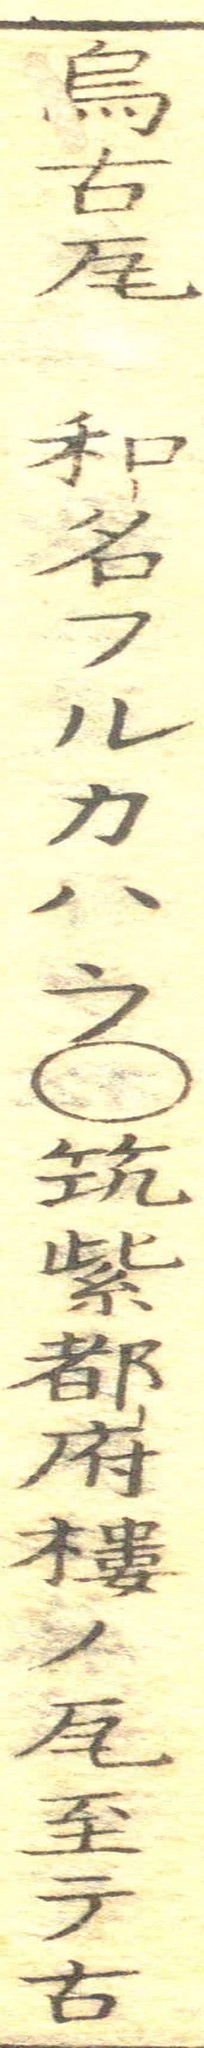烏古尾和-名フルカハラ○筑紫都-府楼ノ瓦至テ古
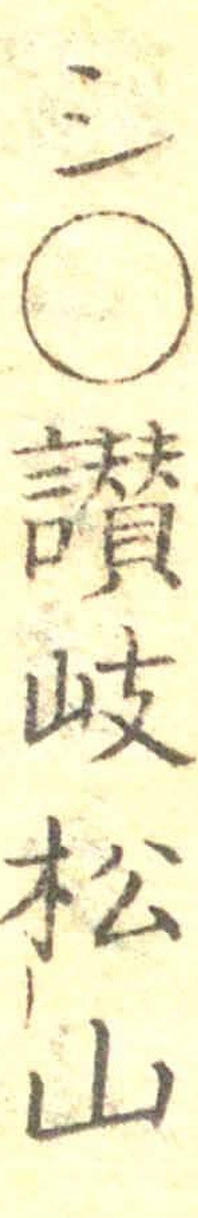シ○讃岐松-山
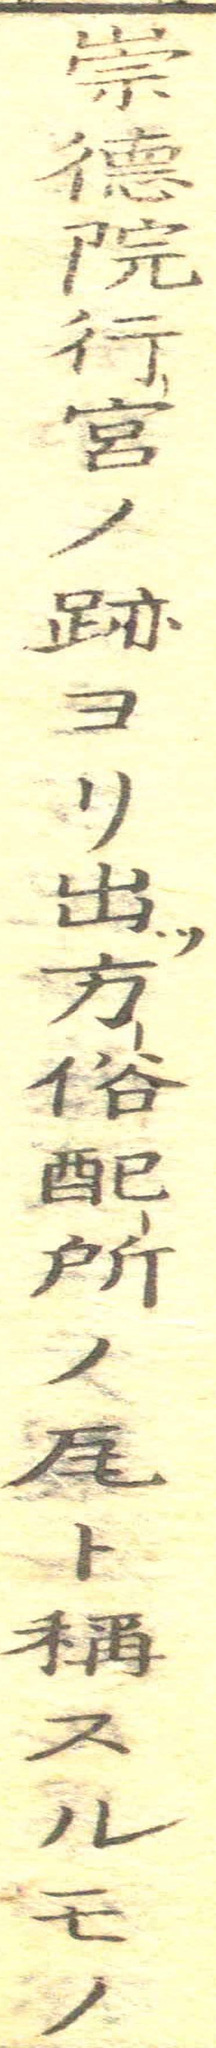崇徳院行-宮ノ跡ヨリ出方-俗配-所ノ瓦ト称スルモノ
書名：物類品隲
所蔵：国文学研究資料館
